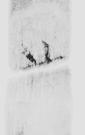廿
